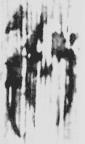死
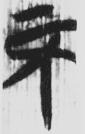不
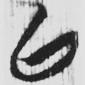㠯（以）
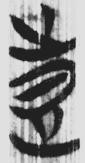○（疐）
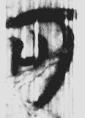可（何）
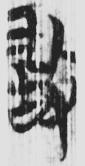敢
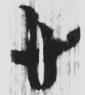心
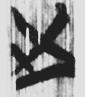之
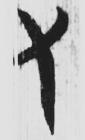又（有）
